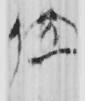位
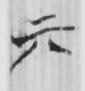亓
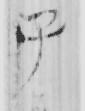子
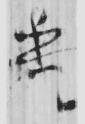弟
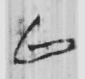㠯（以）
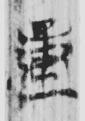量
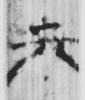亓
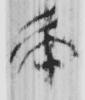帀
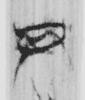改
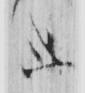之
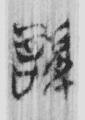{言山一王}
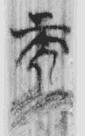而
